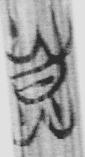莫
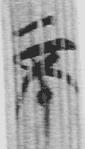不
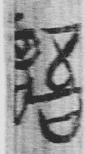語
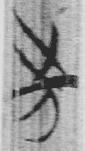之〈先〉
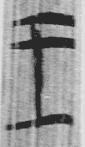王
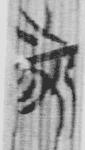之所
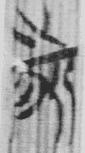所
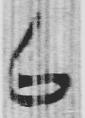㠯（以）
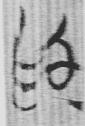爲
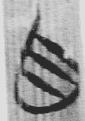目
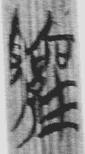觀
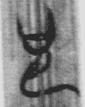也
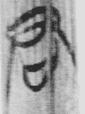君
